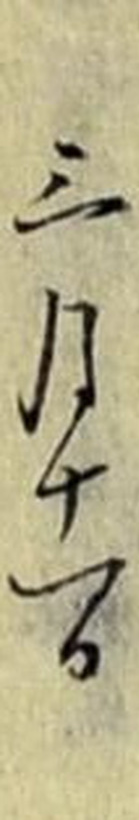三月十一日
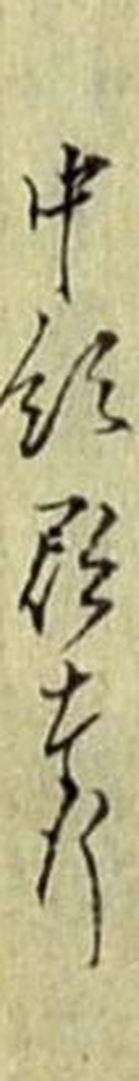上領郡奉行
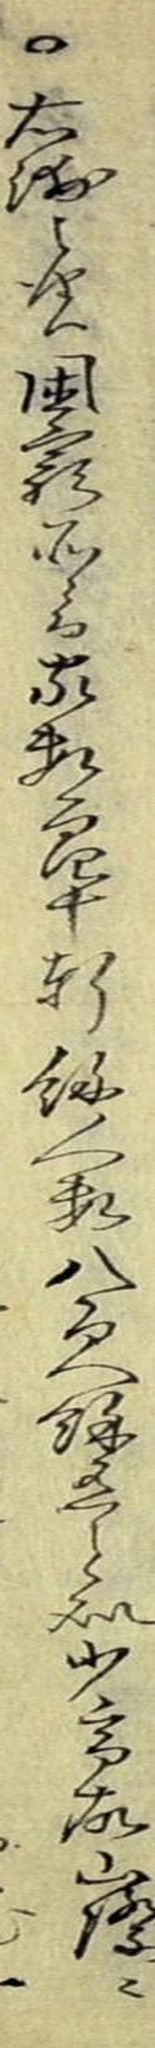○右浦之儀は困窮所に而家数百四十軒餘人数八百人餘有之候処少高故山際に
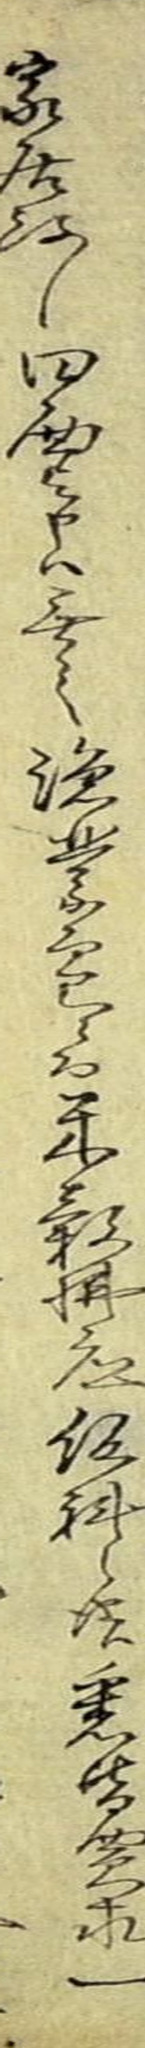家居致し田面と申は無之漁業而己に而米穀払底飯料之儀は悉皆買求一
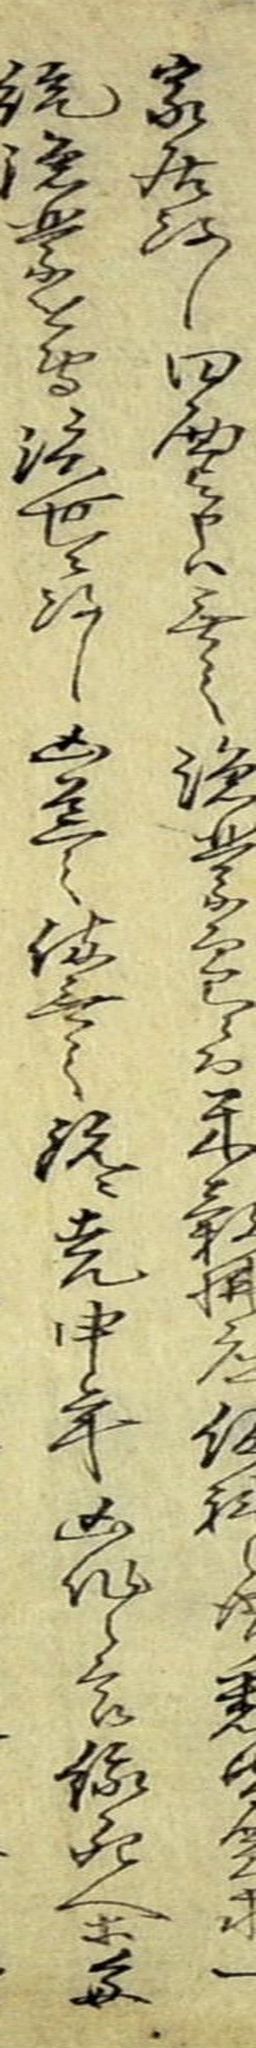統漁業を専渡世に致し凶荒之備無之既に去申年凶作之節俄死人等多
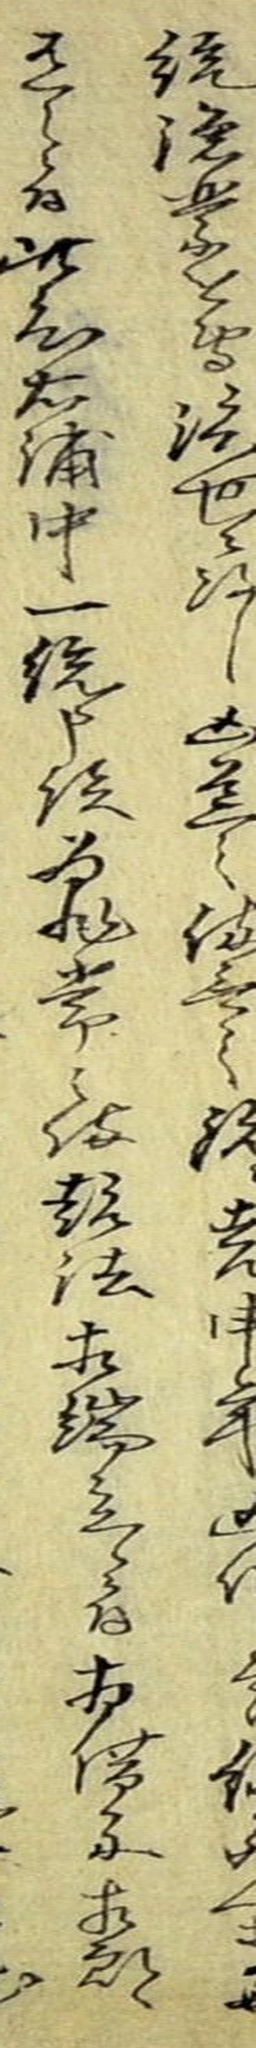有之候付此度右浦中一統申談為非常之備趣法相端立候に付拝借米相願候
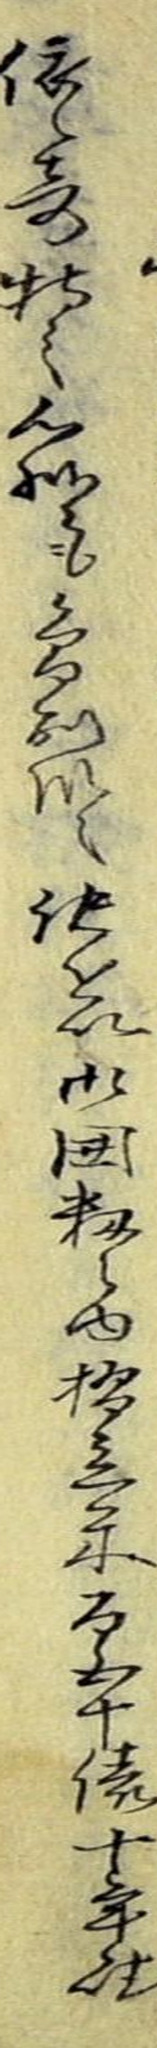依之奇特之心掛にも候間別段之訳を以御囲籾之内指立米百五十俵十年賦

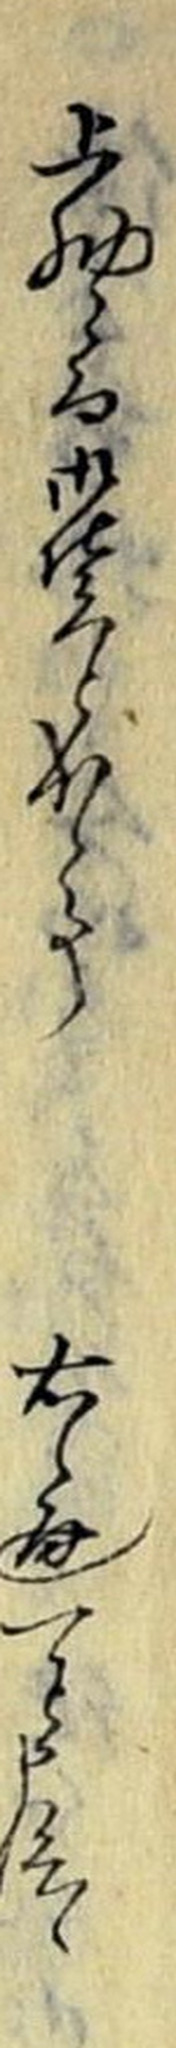上納に而御貸被成候事右之通可被申渡候
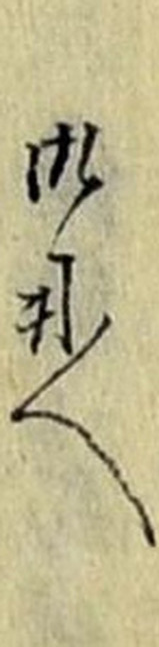御用人
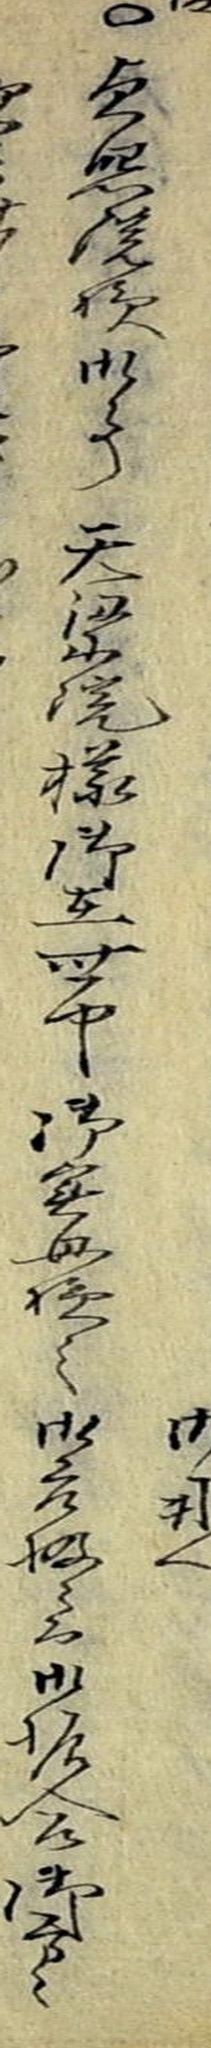○貞照院様御事天梁院様御在世中御実母様之御取扱に而御振合御方々
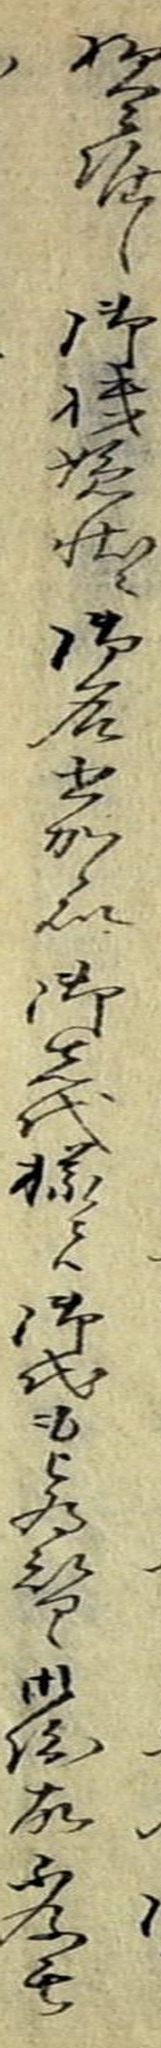様に准し御機嫌状之御名書加候処御先代様には御代も被為替候御儀故不及其
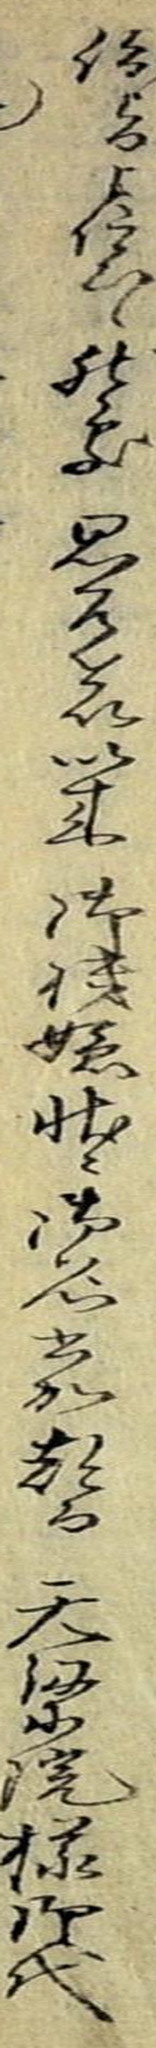儀旨被仰出候然処思召を以以來御機嫌状に御名書加都而天梁院様御代
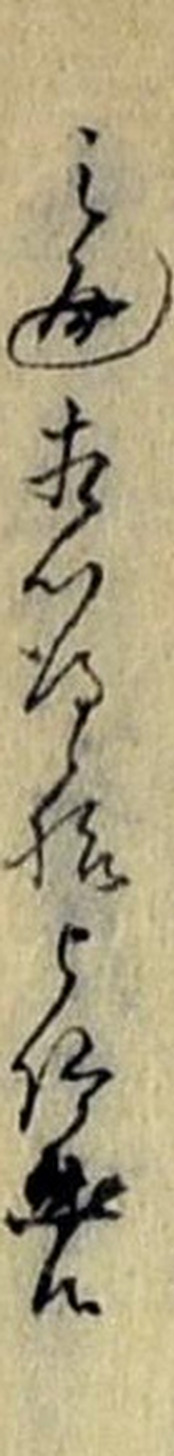之通相心得候様被仰出候
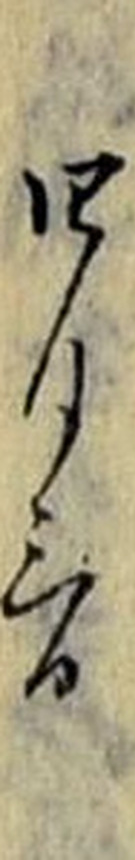四月三日
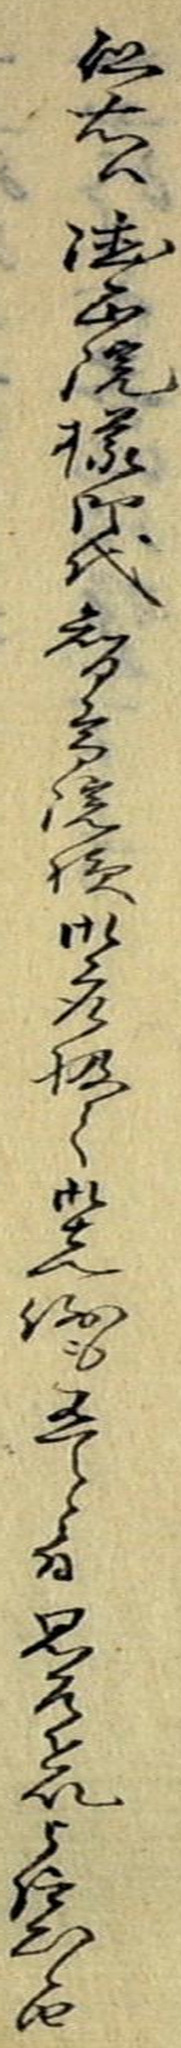但右は徳正院様御代智高院様御取扱の御先例も有之候に付思召を以被仰出候由
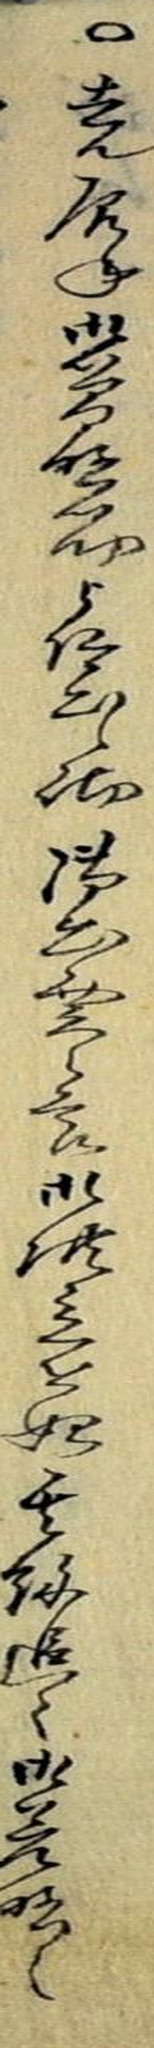○去ル辰年御簡略筋被仰出候砌御出殿之節御供立を始其餘追々御差略之
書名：命令之部 六
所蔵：福井県文書館 Fukui Prefectural Archives
